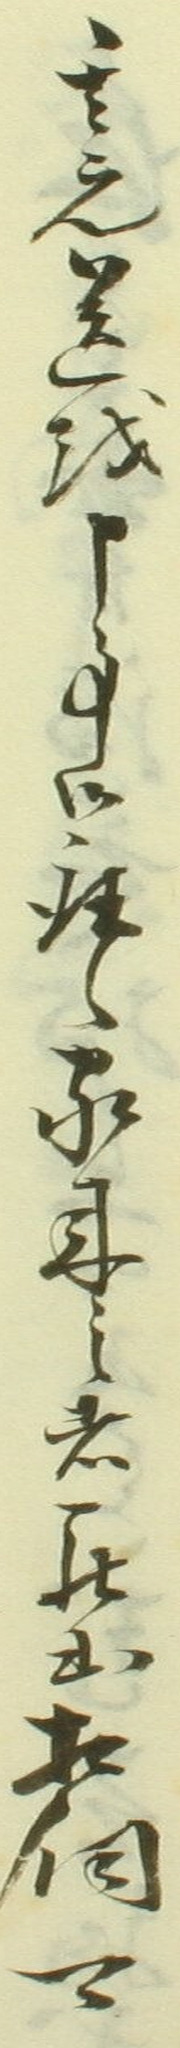其元送越申事御座候家来之者罷出相伺可
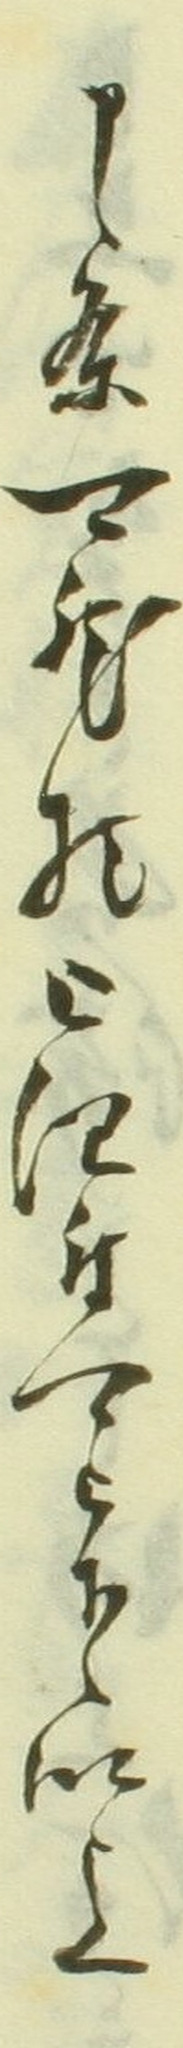申候条可然様被任付可被下候以上
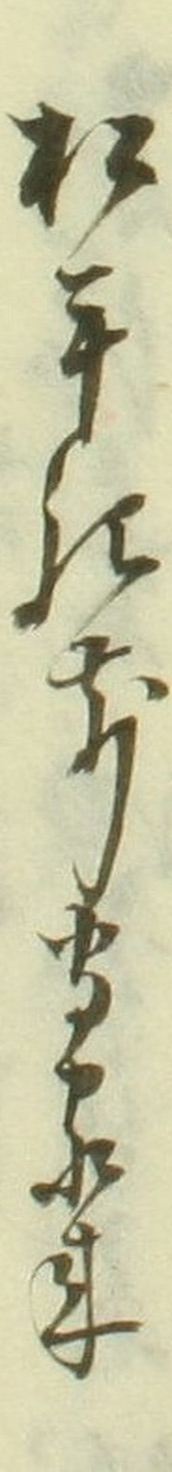松平肥前守家来
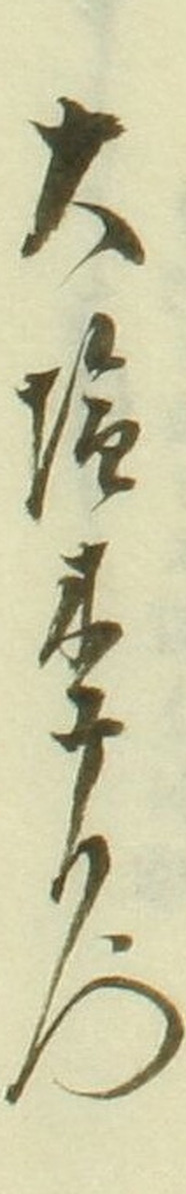大塩杢左衛門
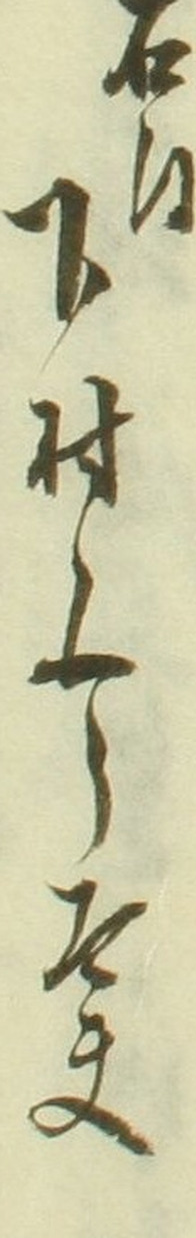下村五郎太夫
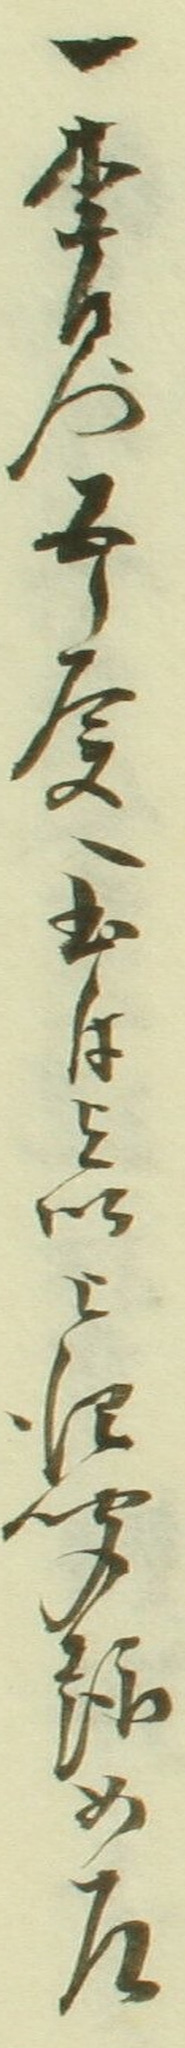一杢左衛門五郎太夫へ書付を以て被任聞趣如左
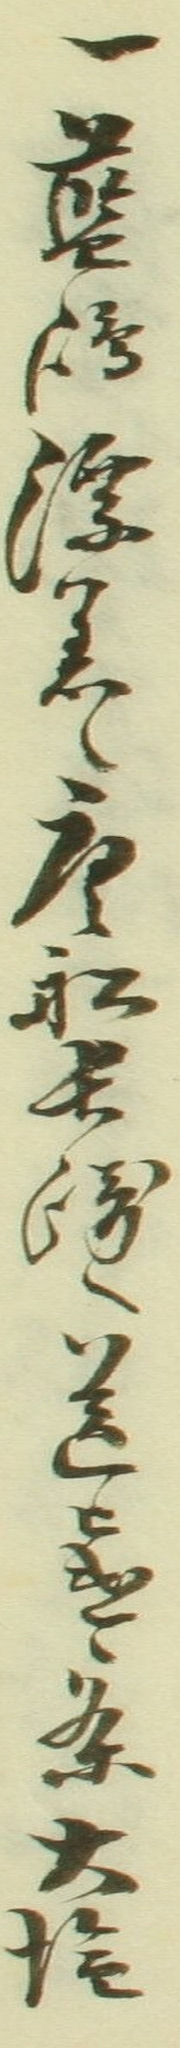一藍嶋漂着之唐船長崎へ送被遣候条大塩
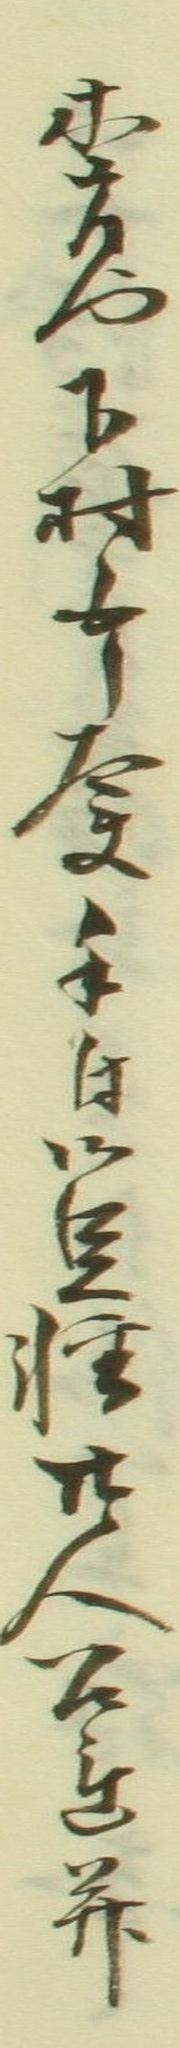杢左衛門下村五郎太夫手付御足軽廿人召連并

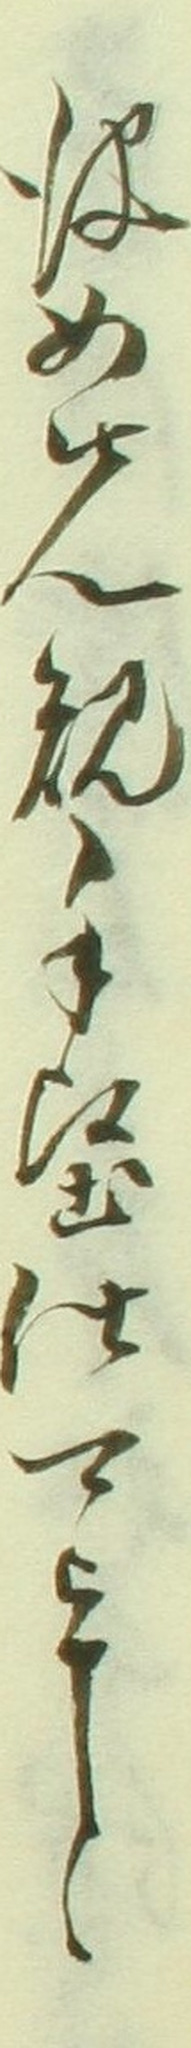儀如先規手堅仕可被申候
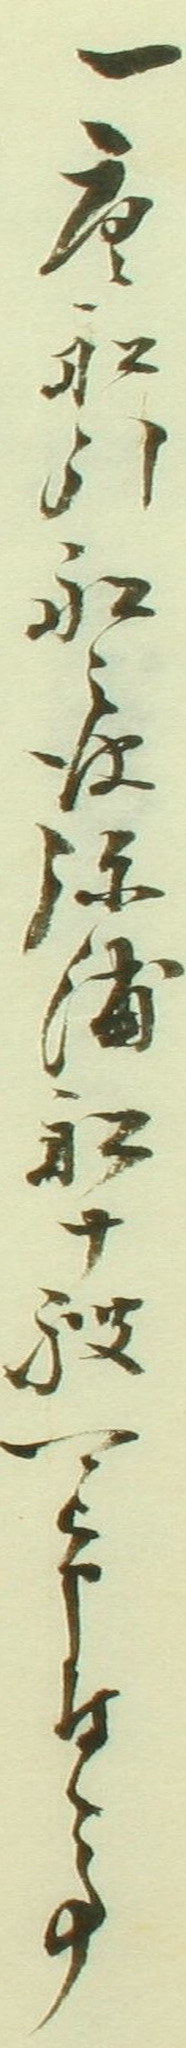一唐船引船之儀弥浦船十艘可被申付候事
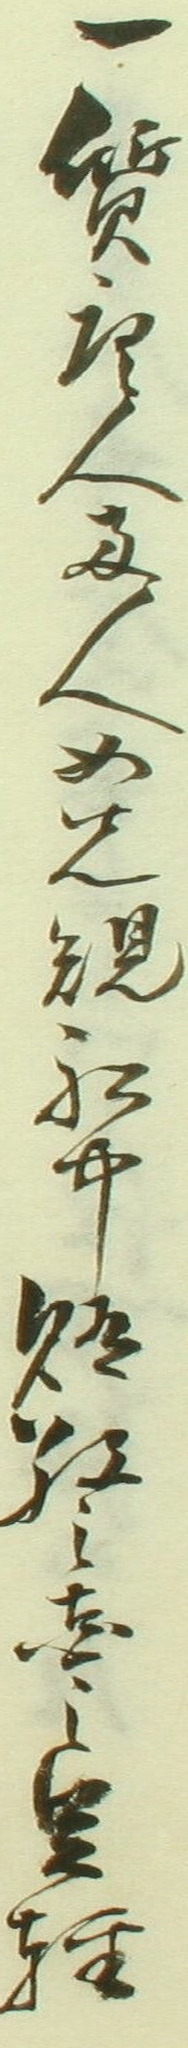一質唐人両人如先規船中賄警固之足軽
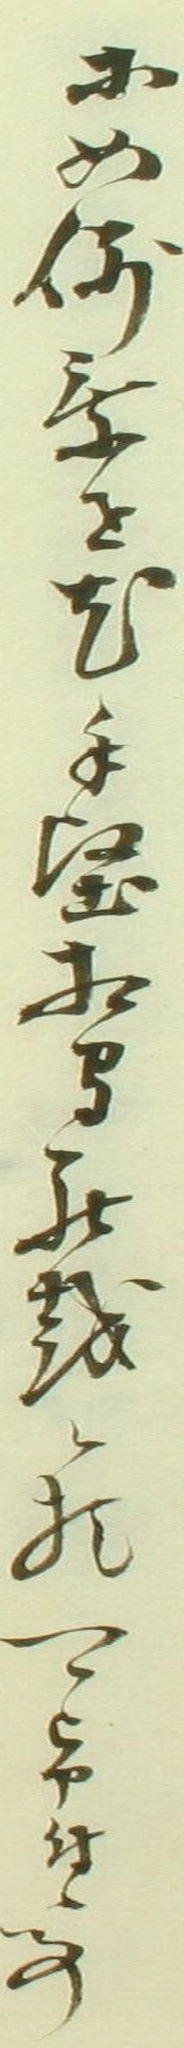等如例乗せ尤手堅相守罷越候様可被申付候事
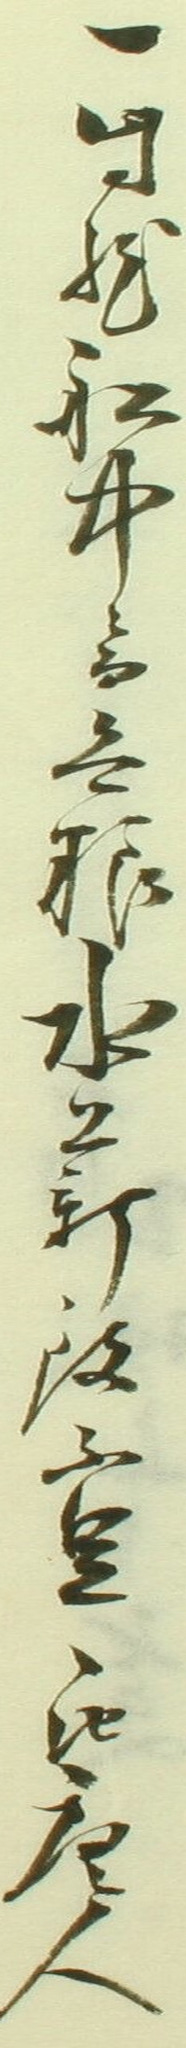一自然船中ニ而兵糧水薪致不足候由唐人
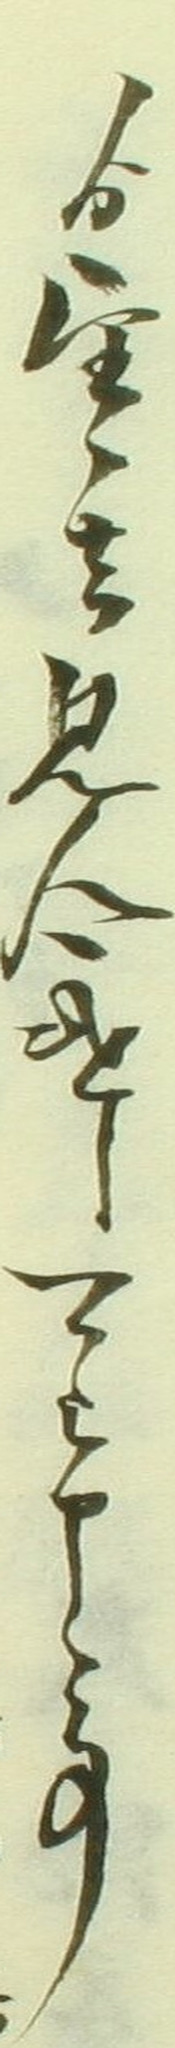ゟ望其見合遣し可被申候事
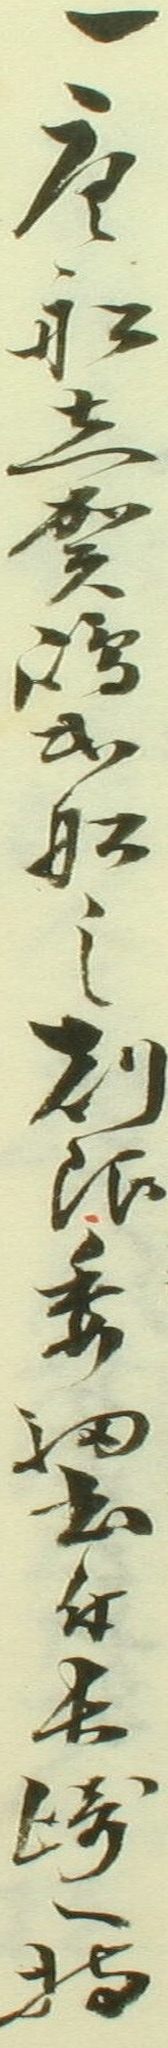一唐船志賀嶋出船之刻限委細書付長崎へ持
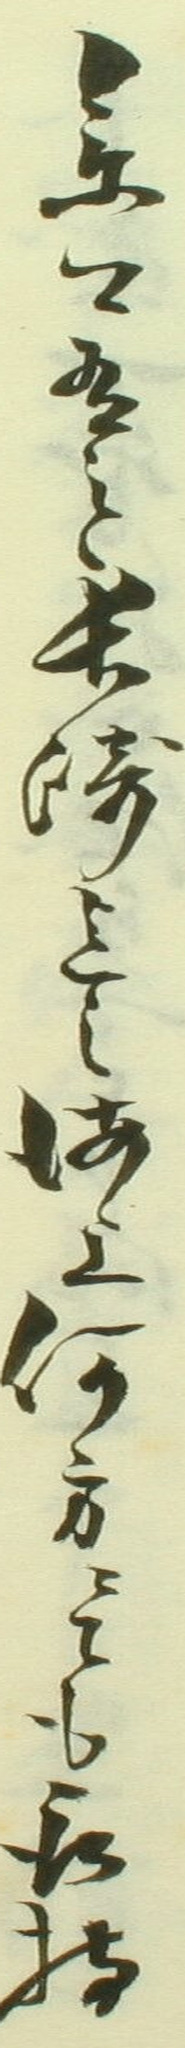参可有之候長崎迄之海上何方ニても取持
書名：異国船漂着記
